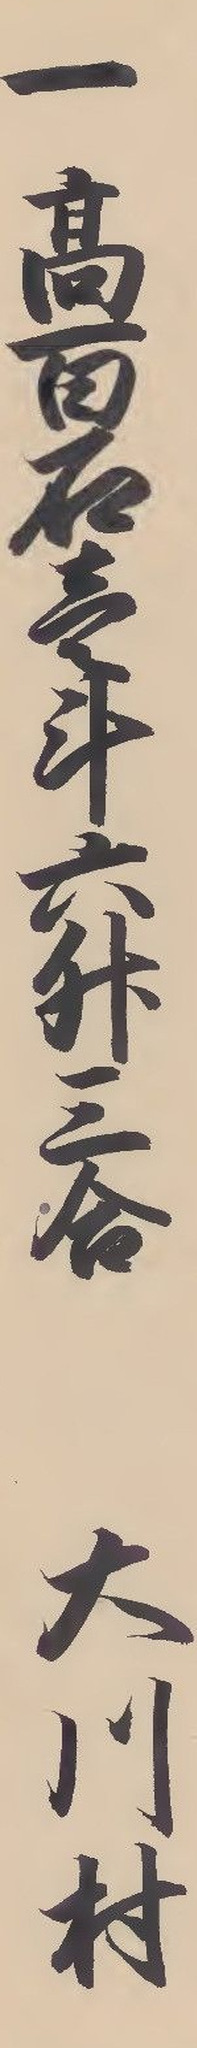一高百石壱斗六升三合大川村

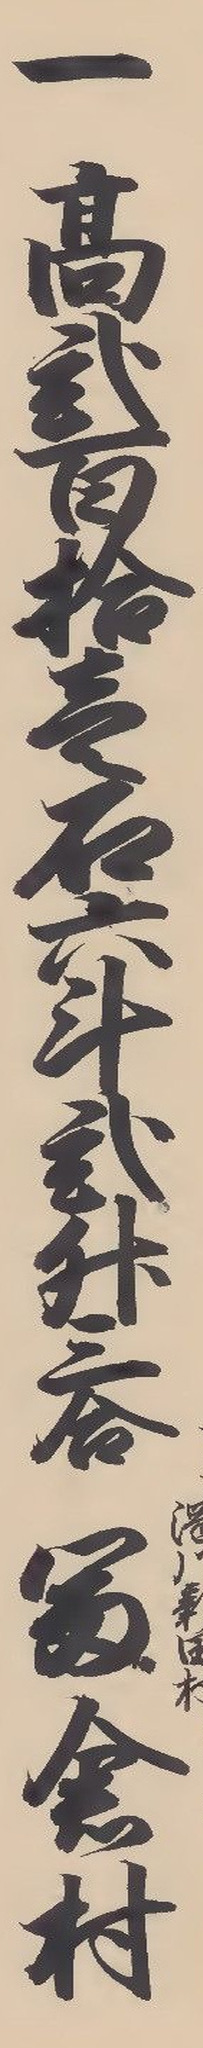一高弐百拾壱石六斗弐升三合富倉村
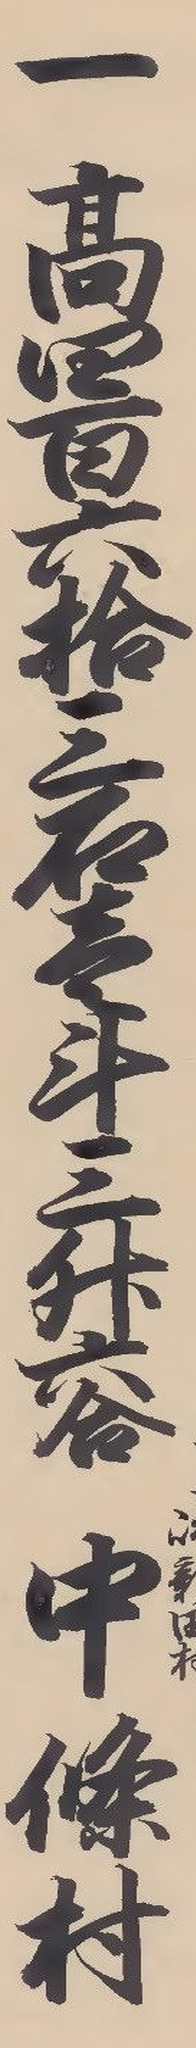一高四百六拾三石壱斗三升六合中条村
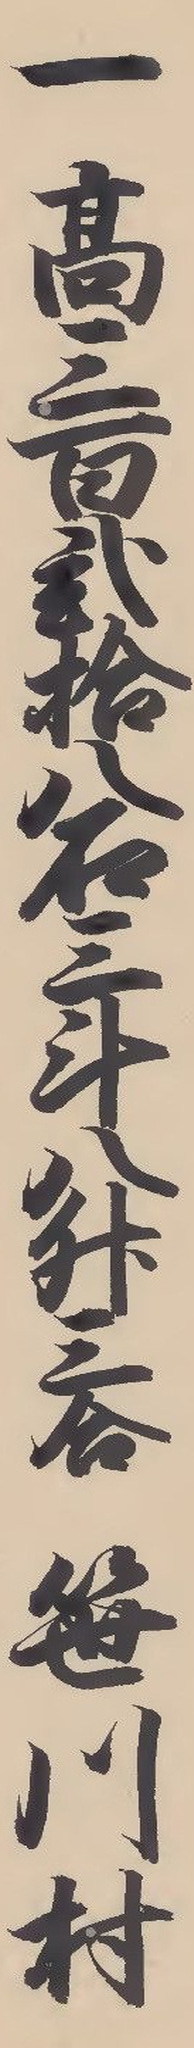一高三百弐拾八石三斗八升三合笹川村
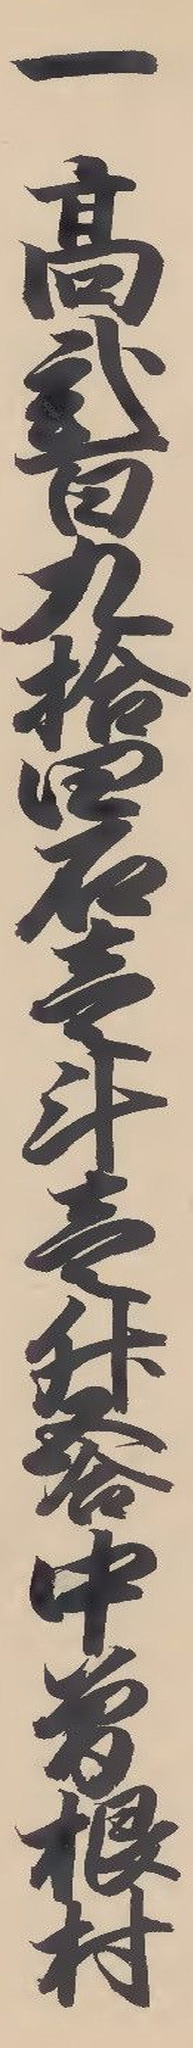一高弐百九拾四石壱斗壱升五合中曽根村
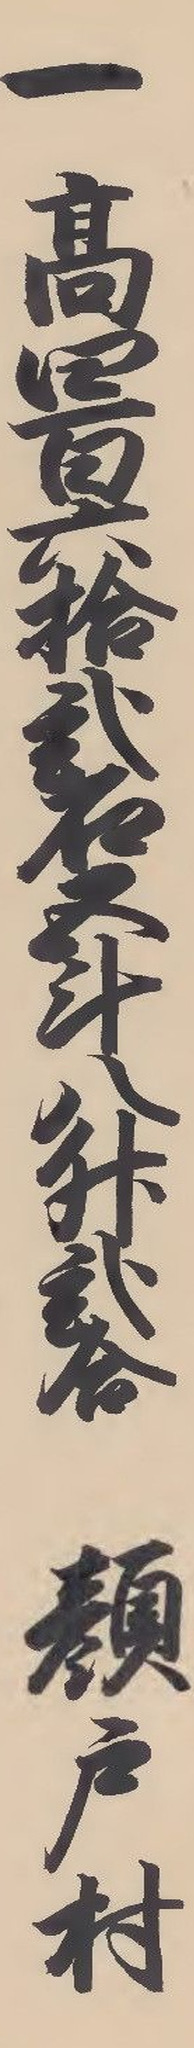一高四百六拾弐石五斗八升弐合顔戸村
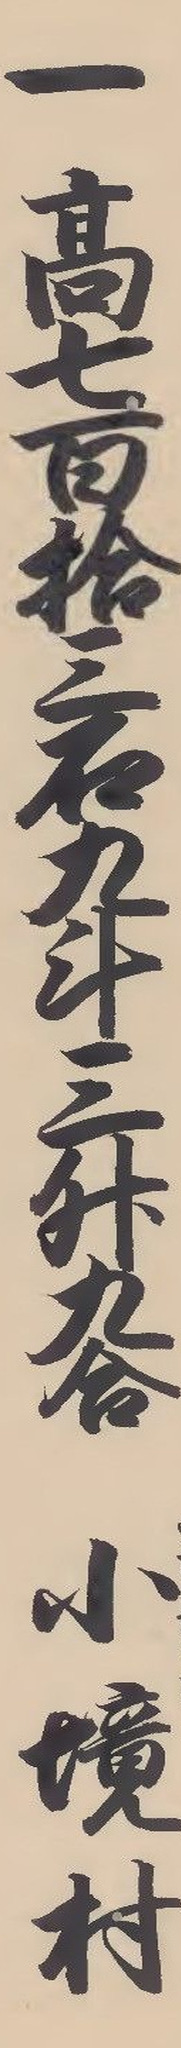一高七百拾三石九斗三升九合小境村
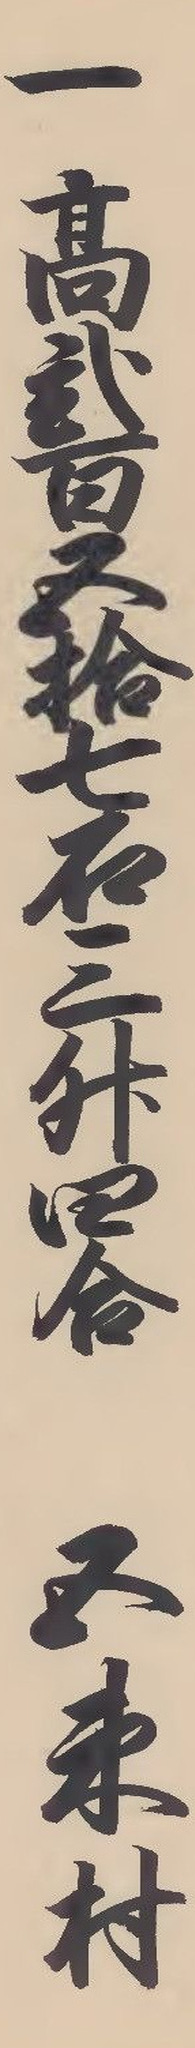一高弐百五拾七石三升四合五束村
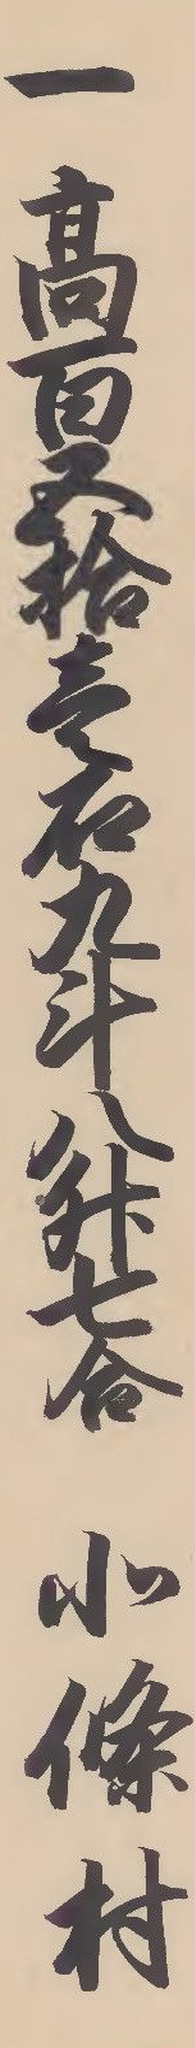一高百五拾壱石九斗八升七合北条村

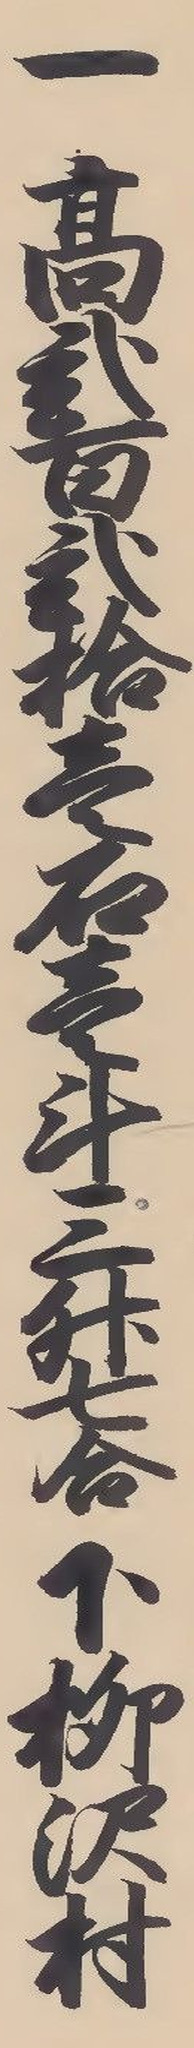一高弐百弐拾壱石壱斗三升七合下柳沢村
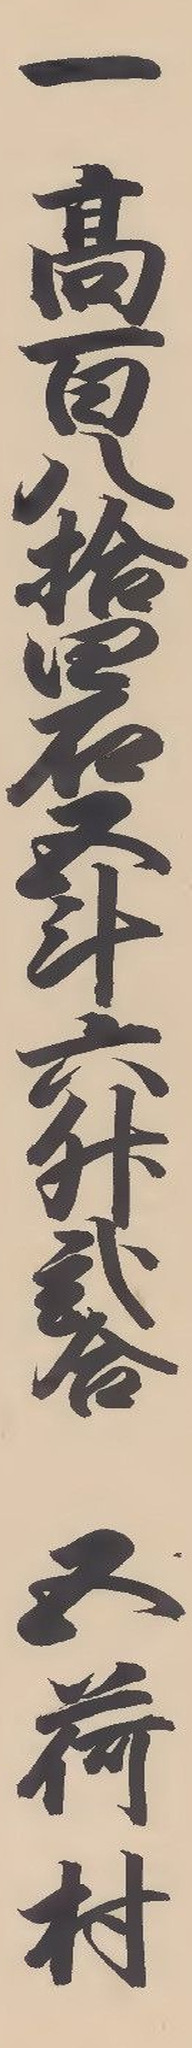一高百八拾四石五斗六升弐合五荷村
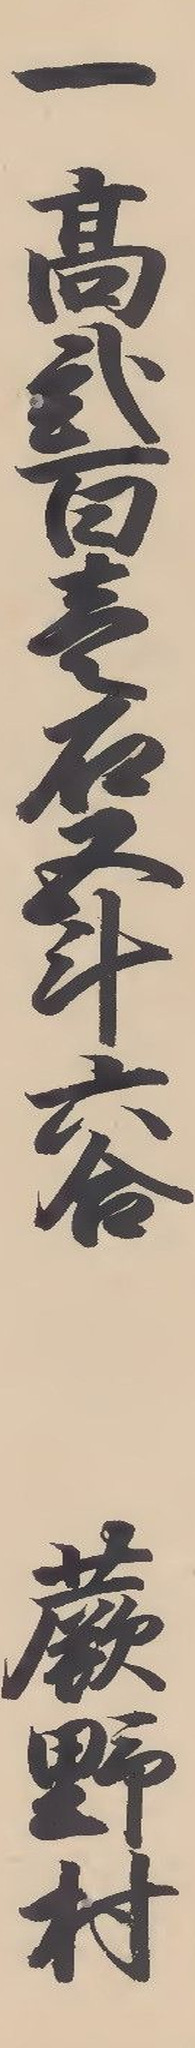一高弐百壱石五斗六合蕨野村
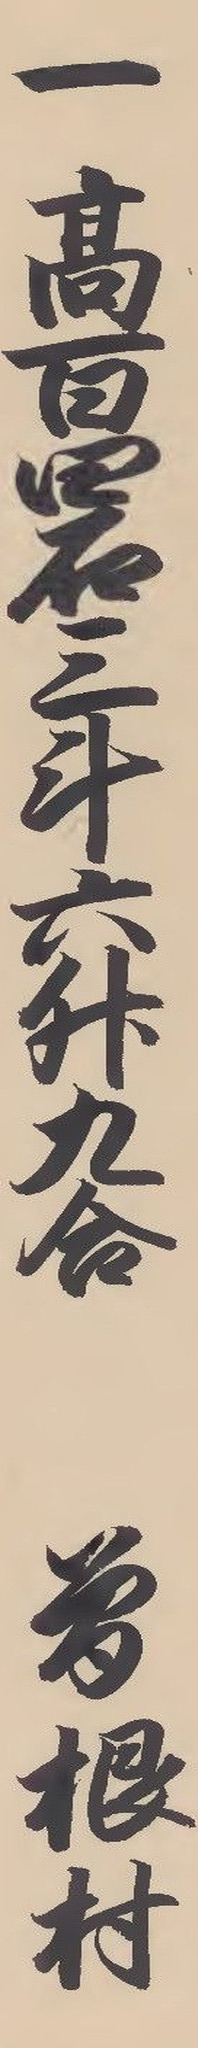一高百四石三斗六升九合曽根村
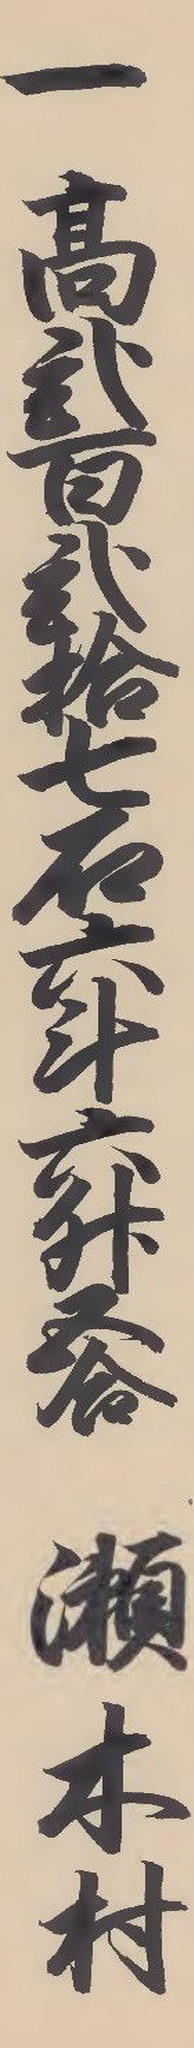一高弐百弐拾七石六斗六升五合瀬木村
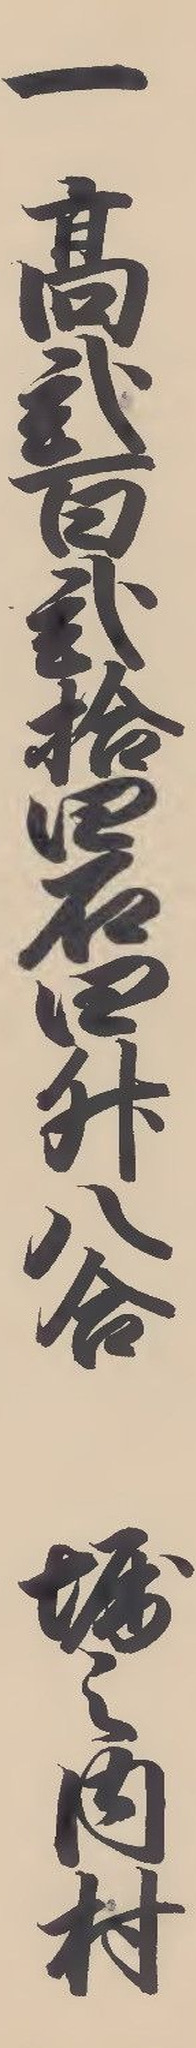一高弐百弐拾四石四升八合堀之内村
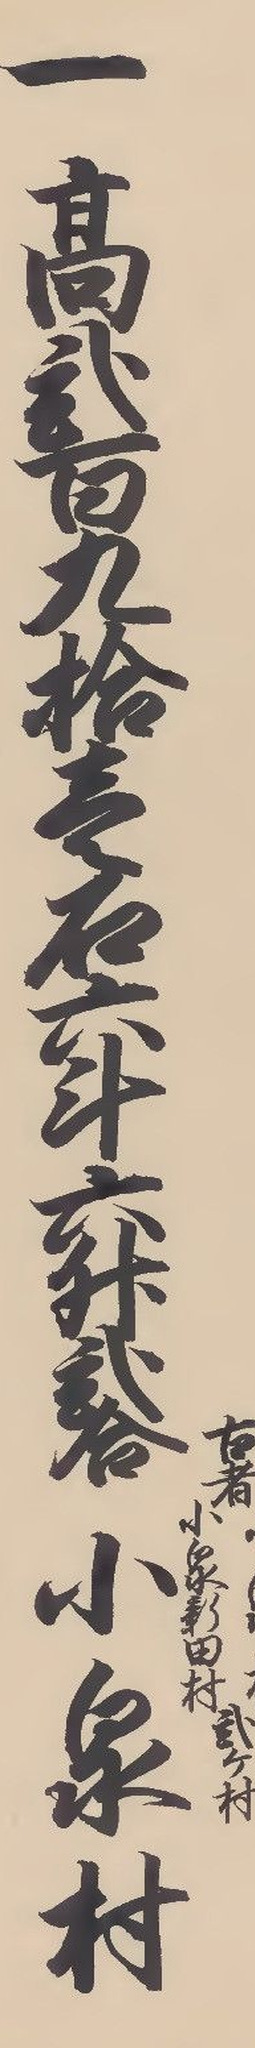一高弐百九拾壱石六斗六升弐合小泉村
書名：信濃国郷帳
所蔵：国立公文書館 National Archives of Japan
